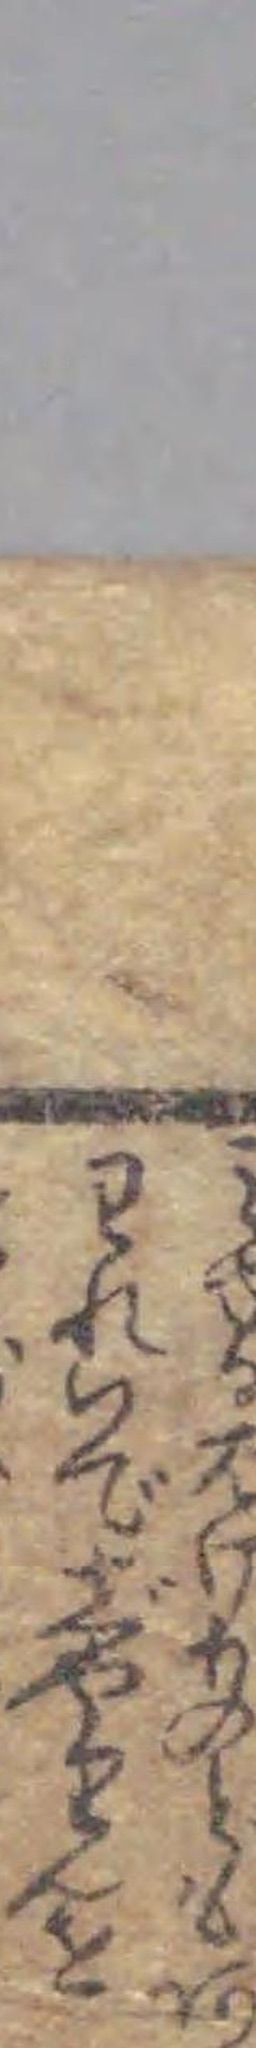われいでじやりんを
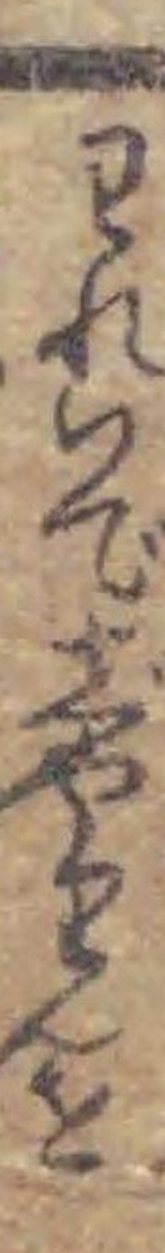われいでじやりんを
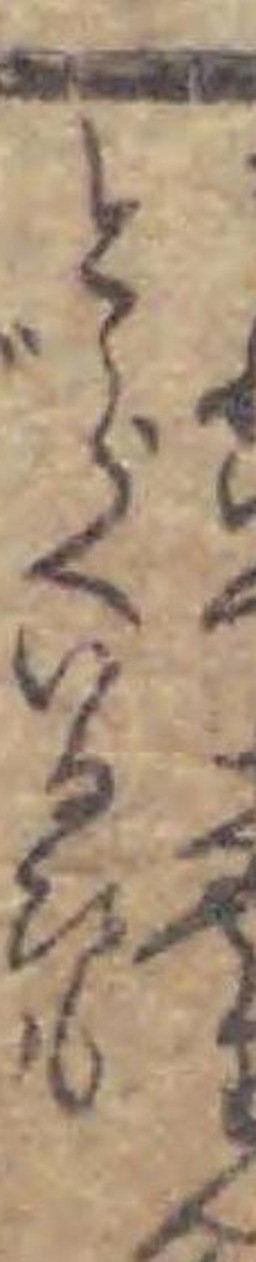とらへいるひも
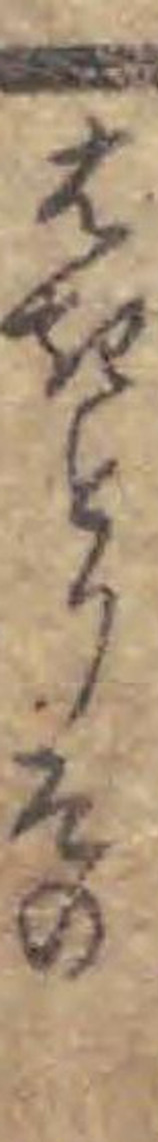はぎとりその
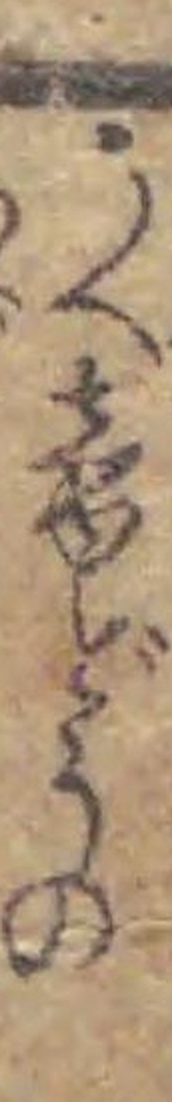うへしゆどうの
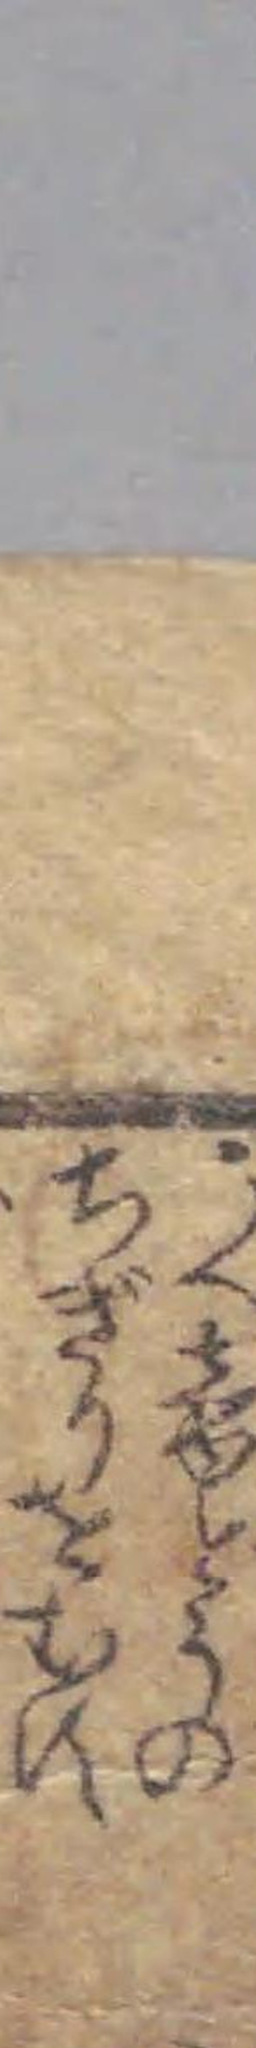ちぎりをむす
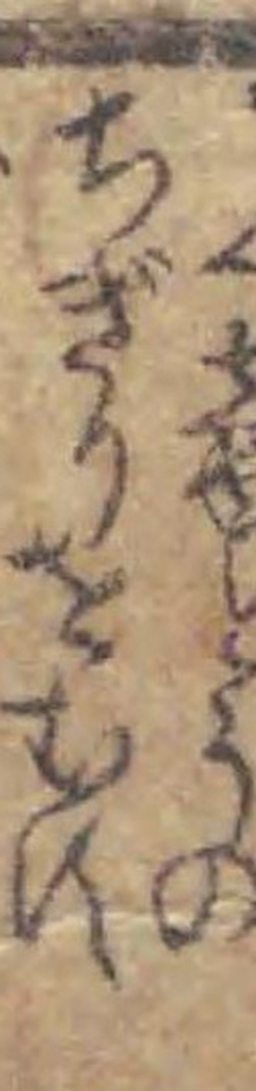ちぎりをむす
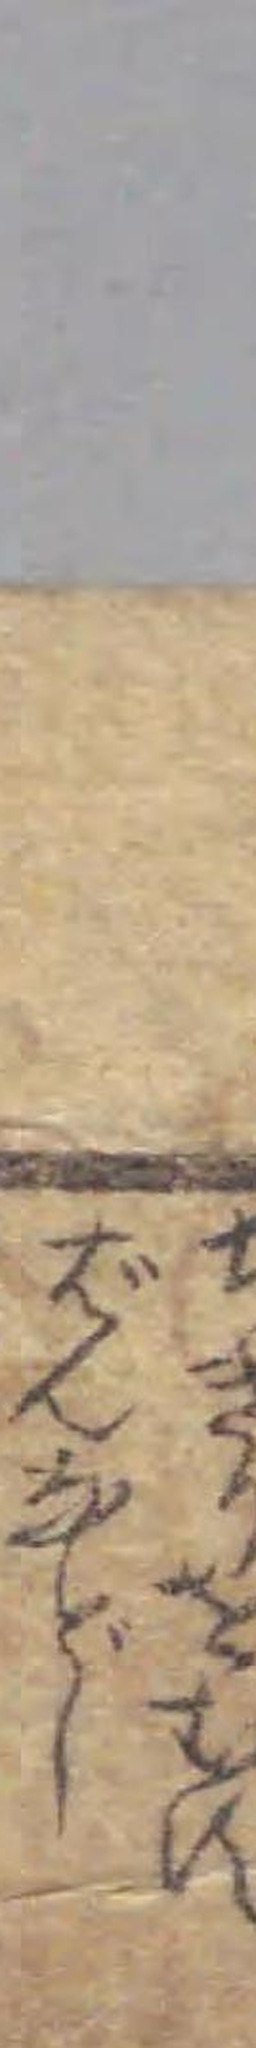ばんなどし
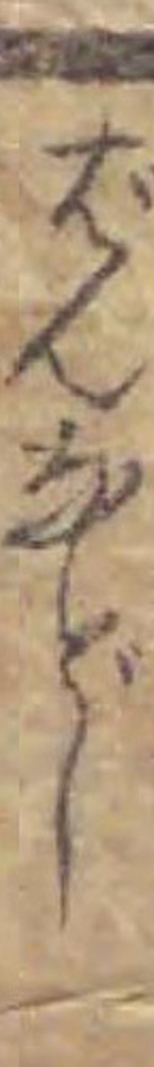ばんなどし
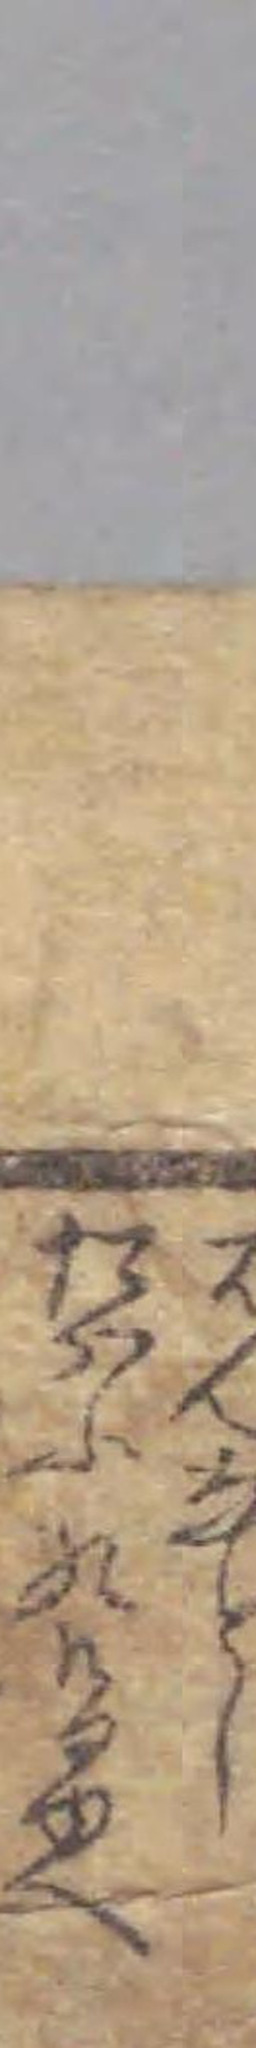たはふれけるゆへ
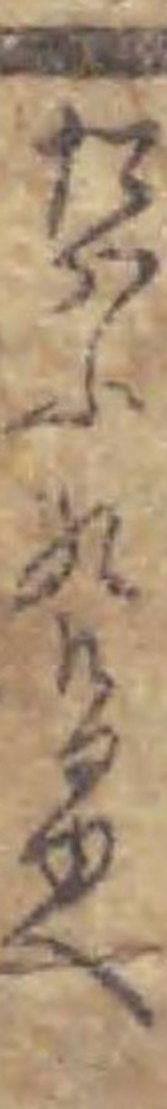たはふれけるゆへ
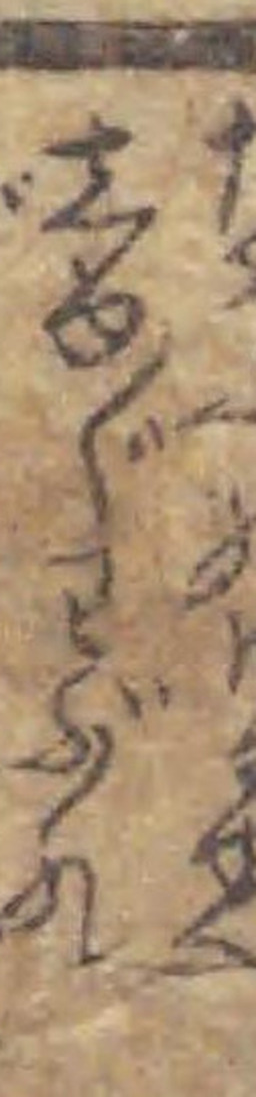しゆ〴〵わぶれ
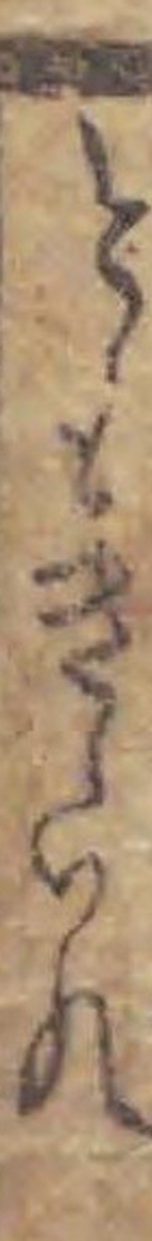どもきゝいれ
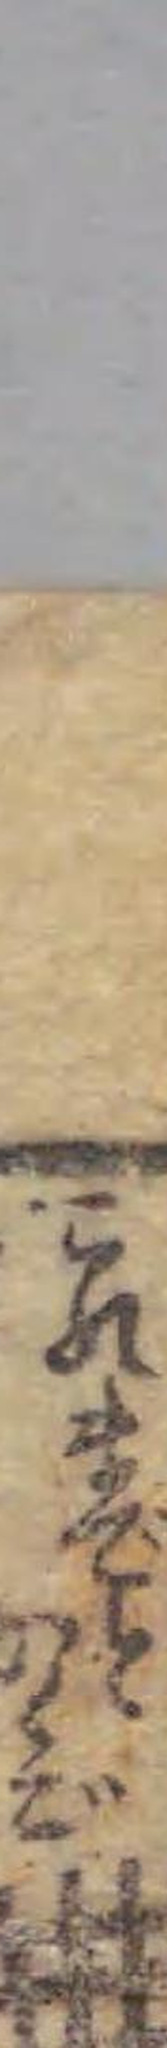これまでと
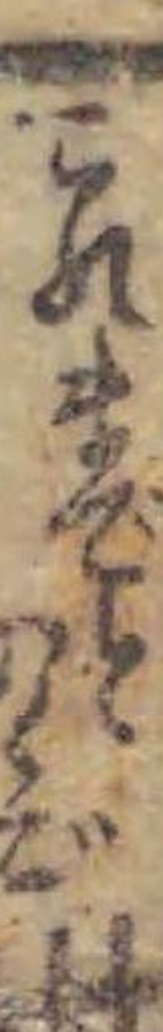これまでと
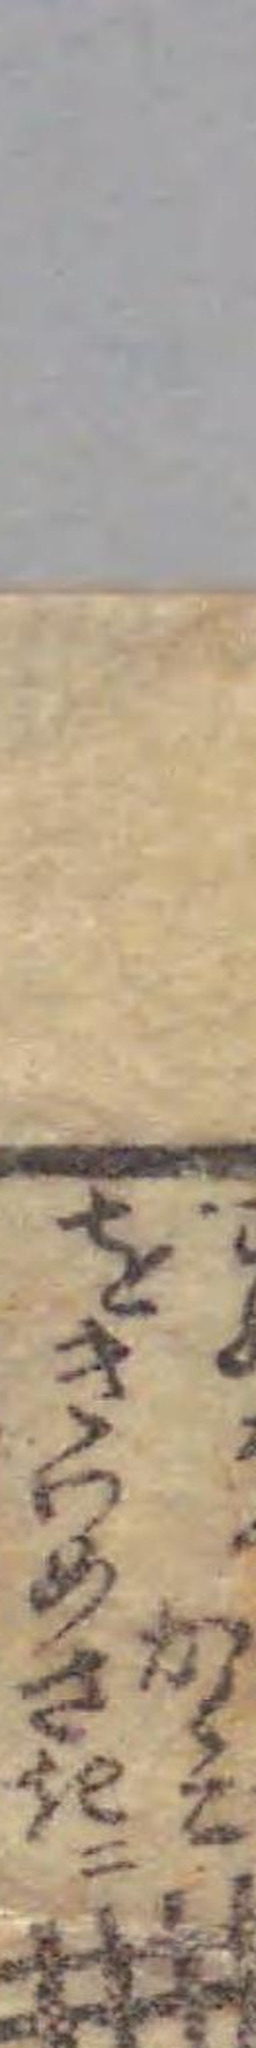をきわめさきに
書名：化物世界夜半嵐 : 3巻
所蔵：国立国会図書館 National Diet Library, JAPAN
